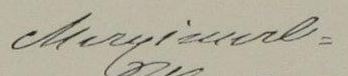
Maximal-
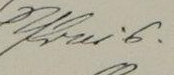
Preis
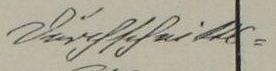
Durchschnitts-
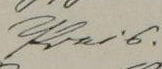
Preis
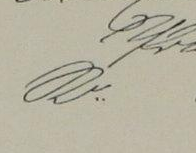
R.
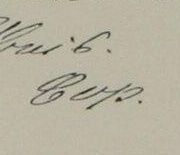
Cop.
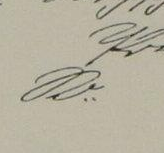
R.
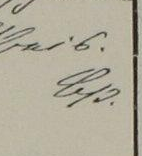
Cop.
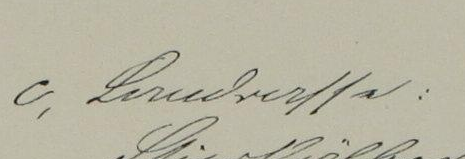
c. Landrasse:
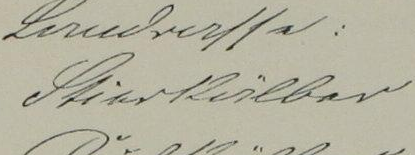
Stierkälber
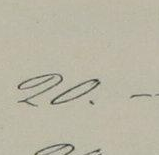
20
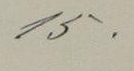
15
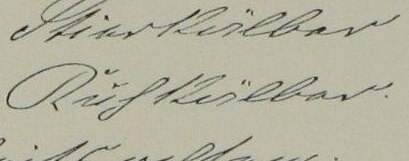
Kuhkälber
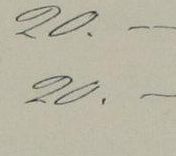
20
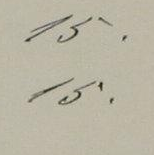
15
